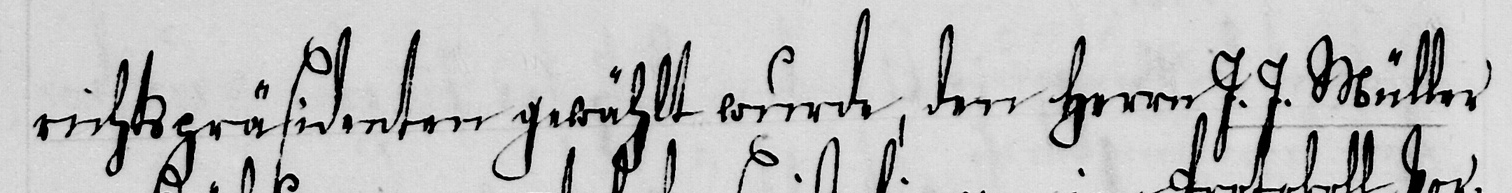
richtspräsidenten gewählt wurde, den Herrn J. J. Müller
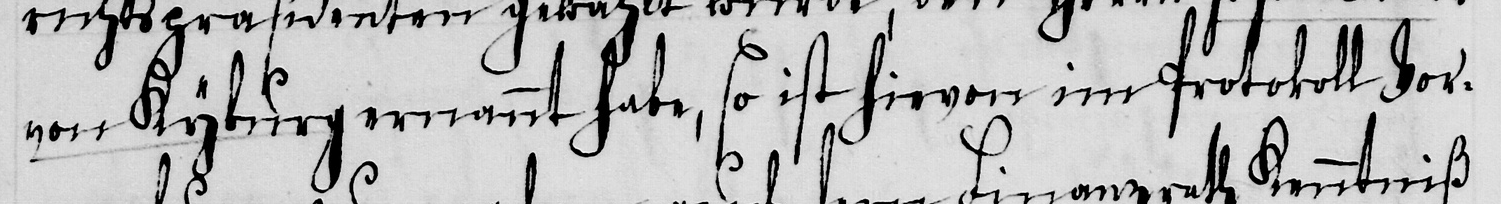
von Kyburg ernannt habe, so ist hievon im Protokoll Vor¬
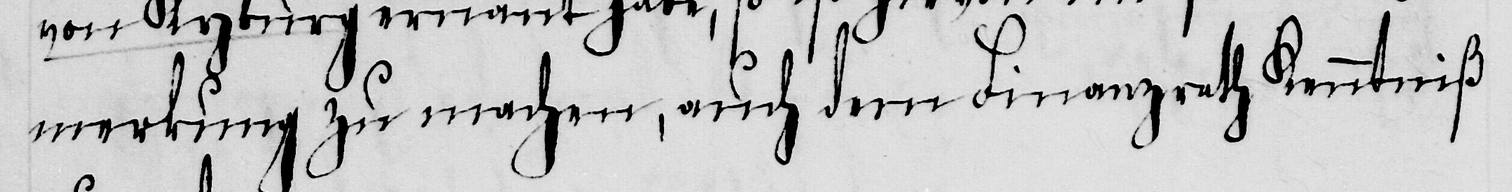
merkung zu machen, auch dem Finanzrath Kenntniß
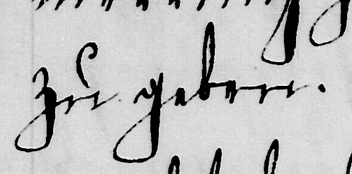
zu geben.
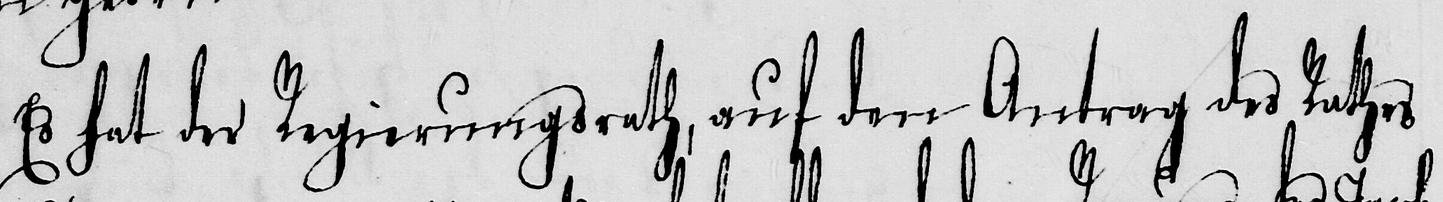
hat der Regierungsrath, auf den Antrag des Rathes
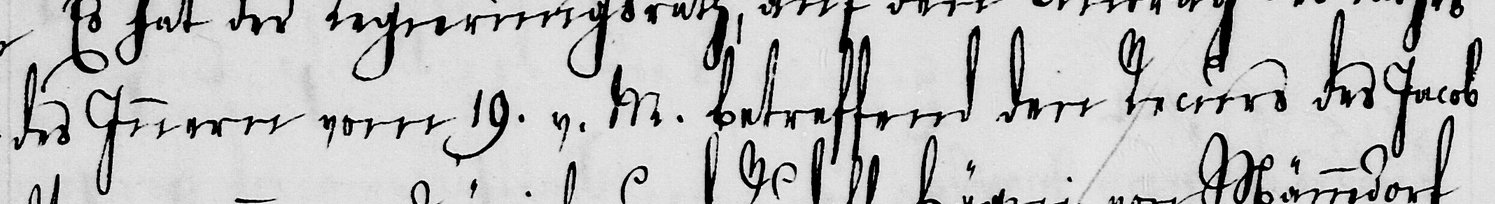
des Innern vom 19. v. M. betreffend den Recurs des Jacob
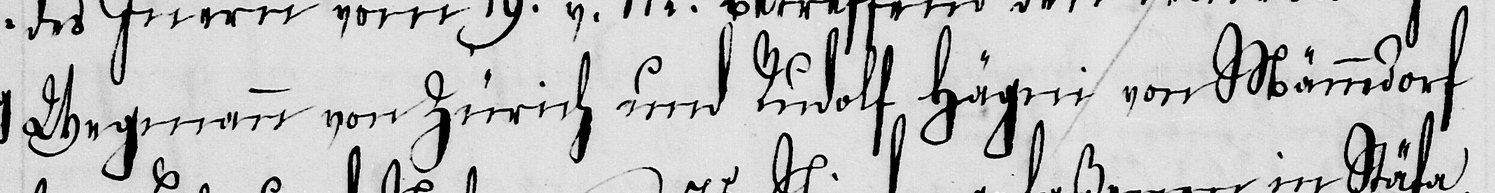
Wegmann von Zürich und Rudolf Hägni von Männedorf
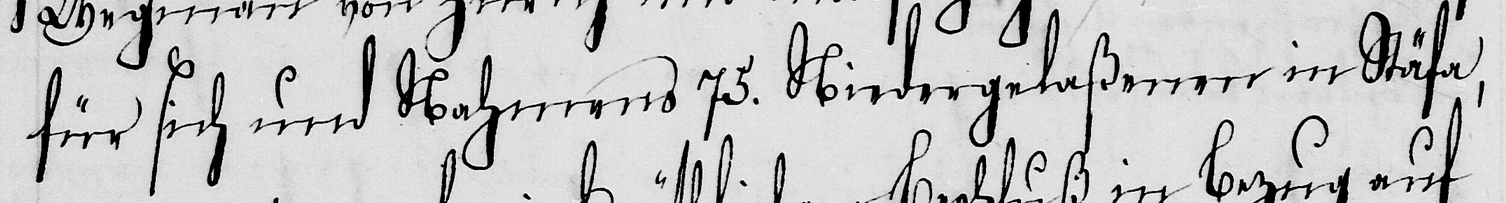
für sich und Nahmens 75. Niedergelaßenen in Stäfa,
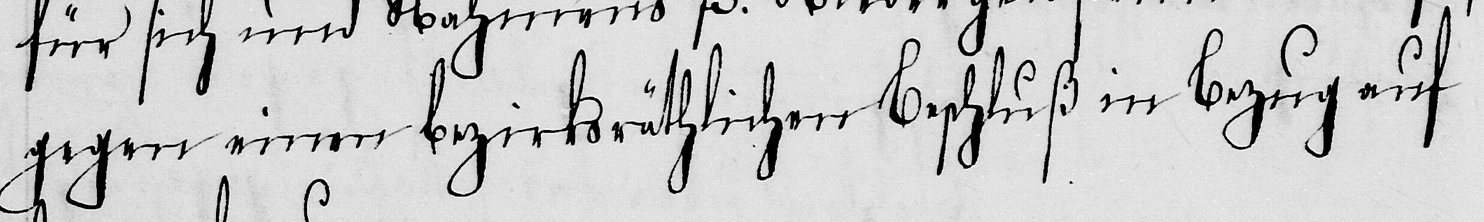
gegen einen bezirksräthlichen Beschluß in Bezug auf
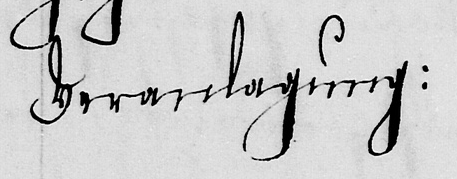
Veranlagung:
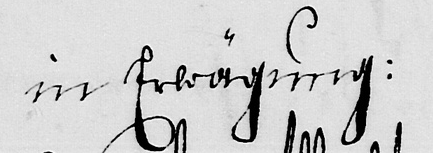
in Erwägung:
